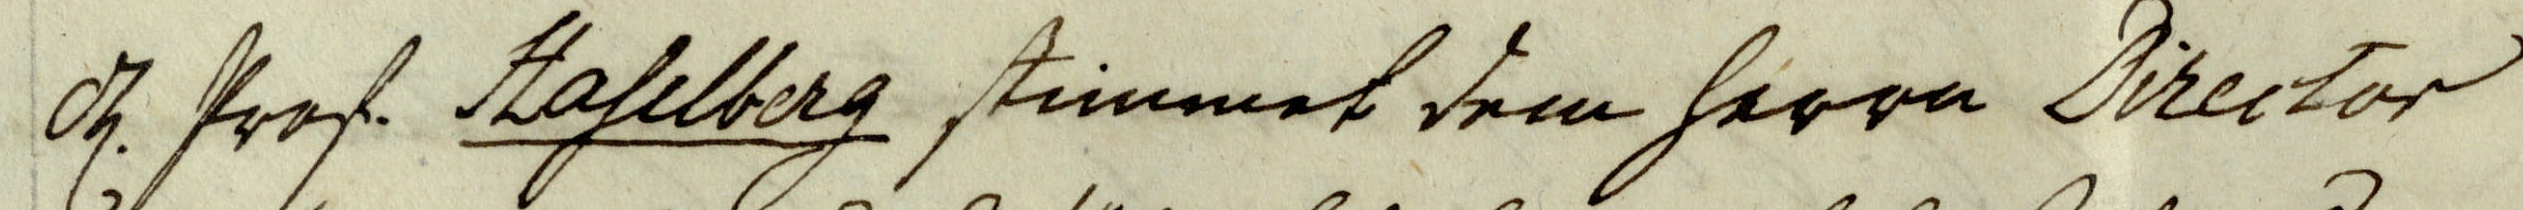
dh. Prof. Haselberg stimmt dem Herrn Director
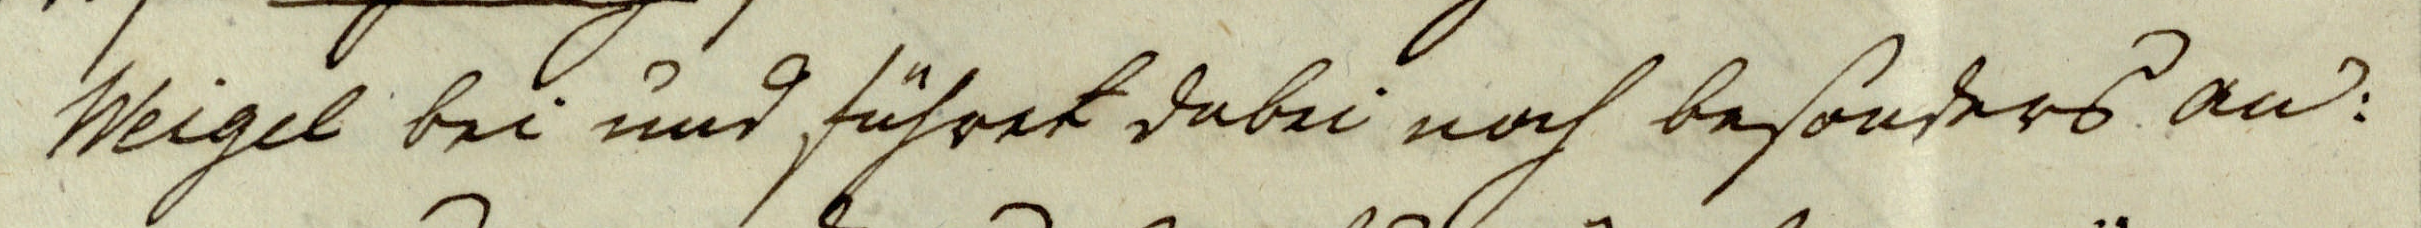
Weigel bei und führet dabei noch besonders an:
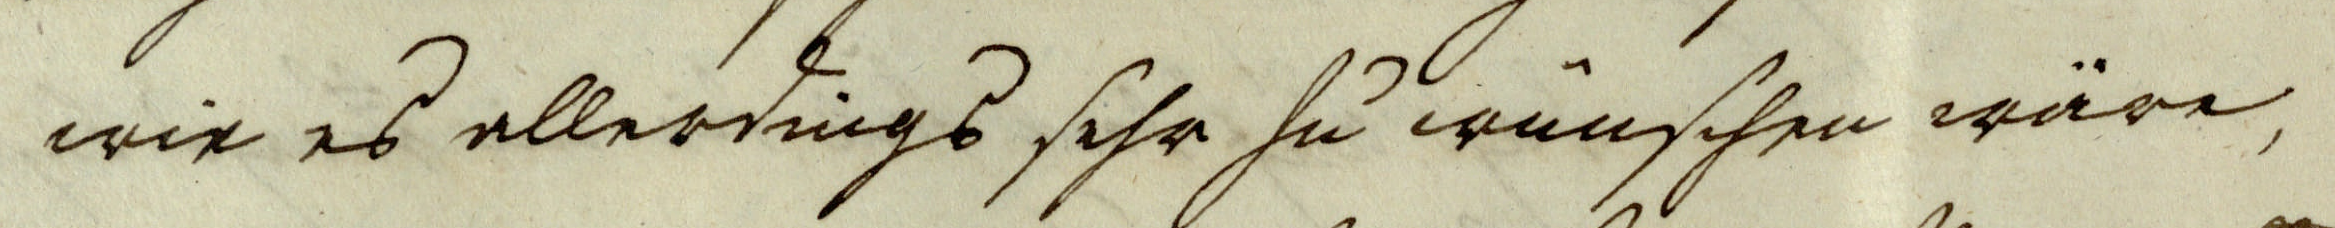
wie es allerdings sehr zu wünschen wäre,
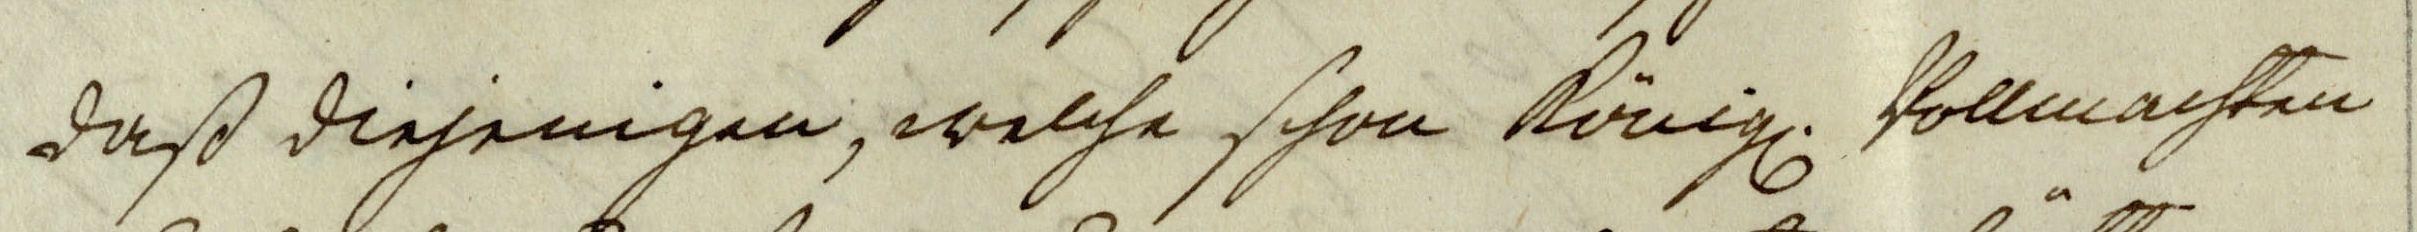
daß diejenigen, welche schon Königl. Vollmachten
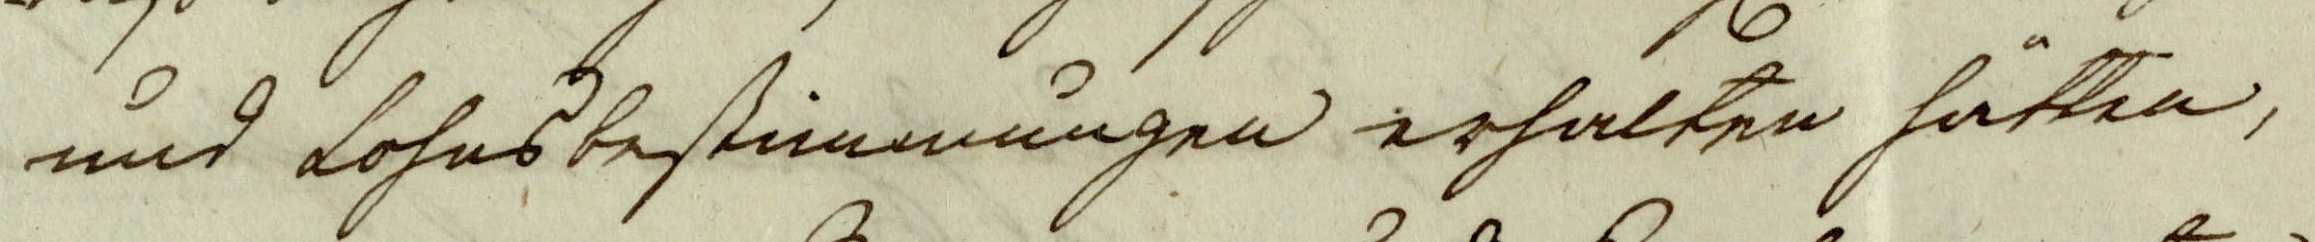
und Lohnsbestimmungen erhalten hätten,
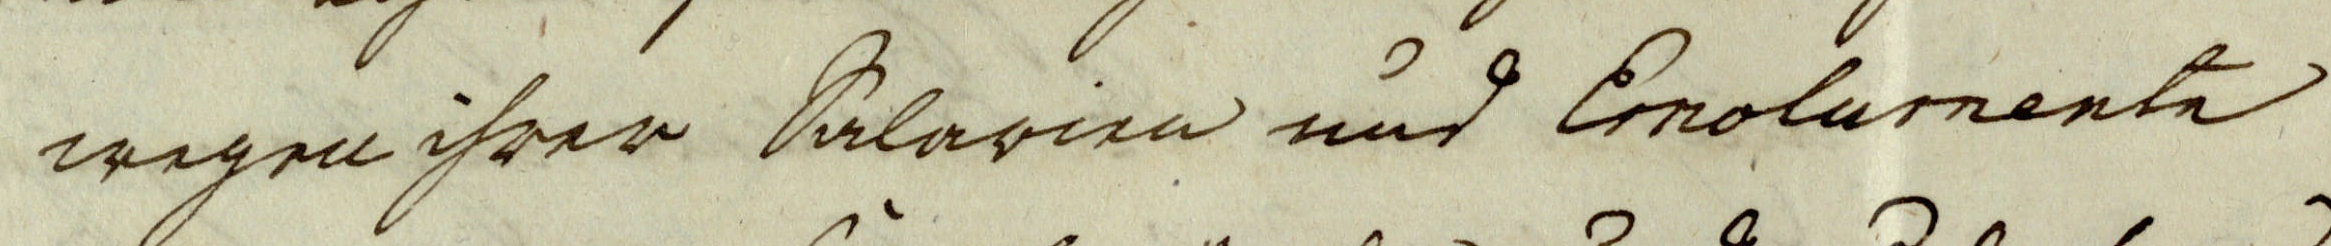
wegen ihrer Salarien und Emolumente
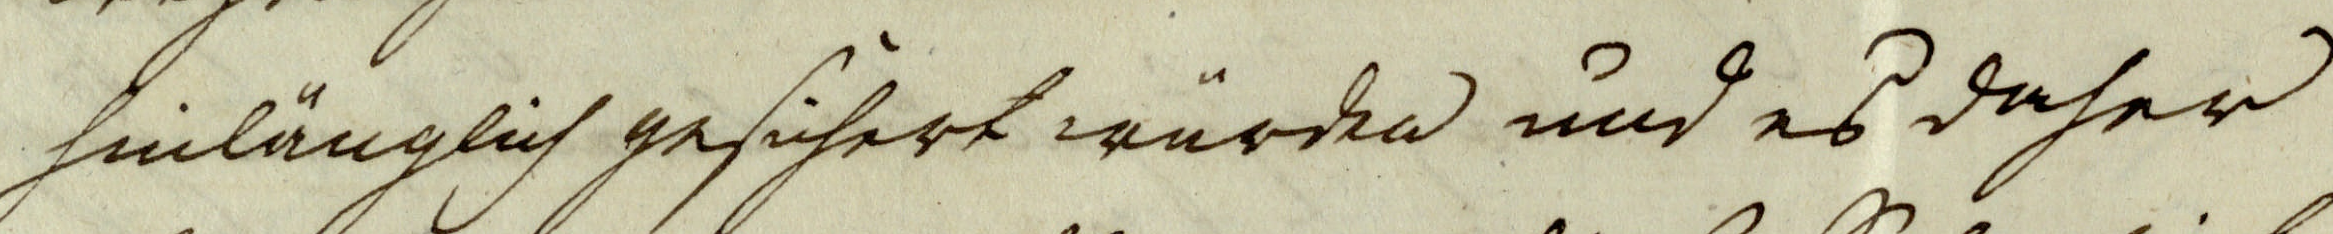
hinlänglich gesichert würden und es daher
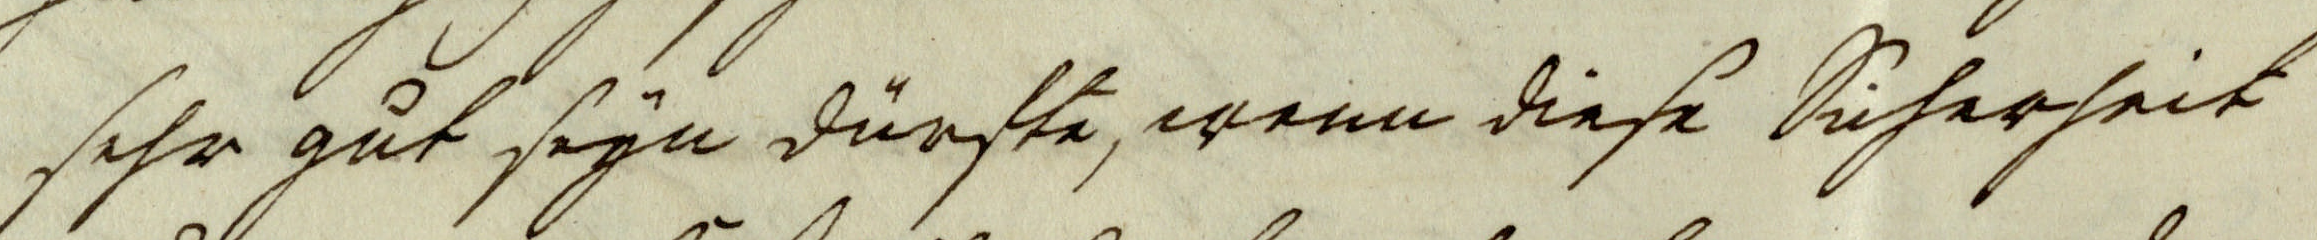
sehr gut seÿn dürfte, wenn diese Sicherheit
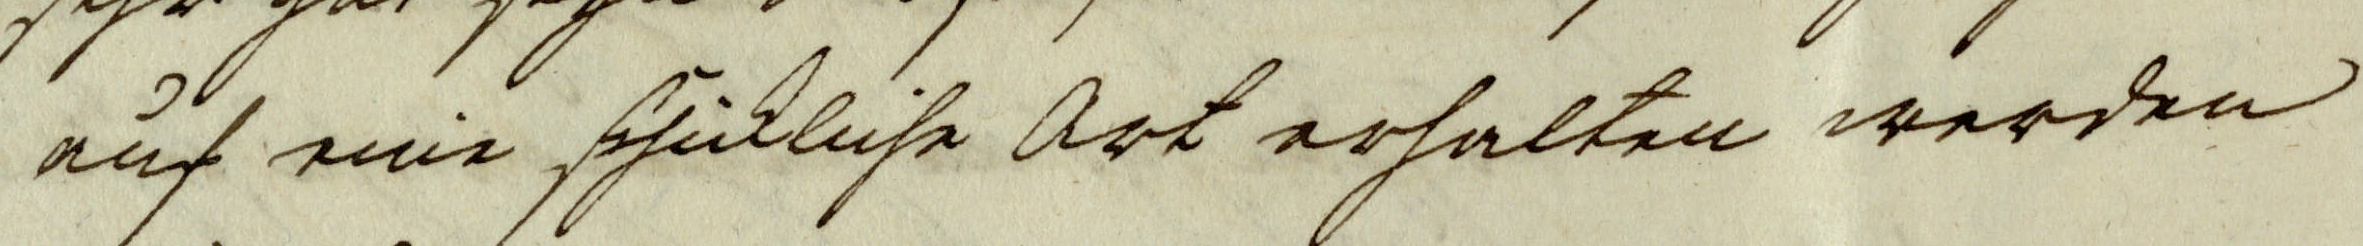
auf eine schickliche Art erhalten werden
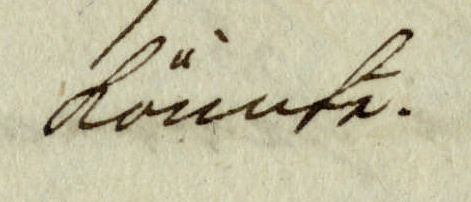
könnte.
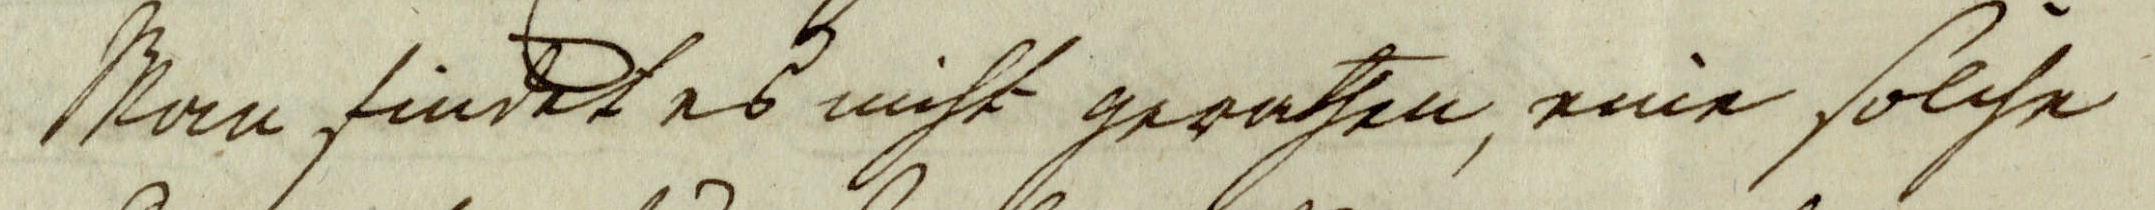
Man findet es nicht gerathen, eine solche
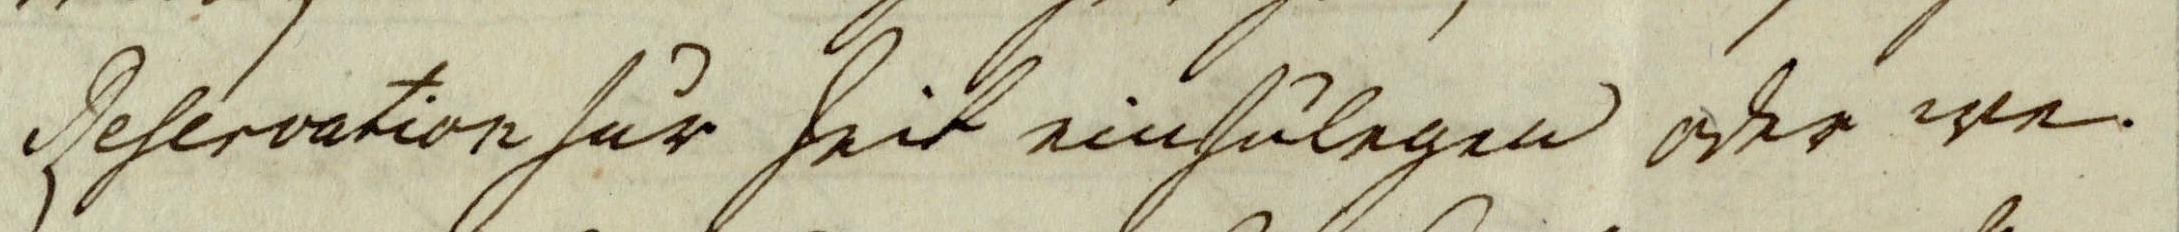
Reservation zur Zeit einzulegen oder we¬
